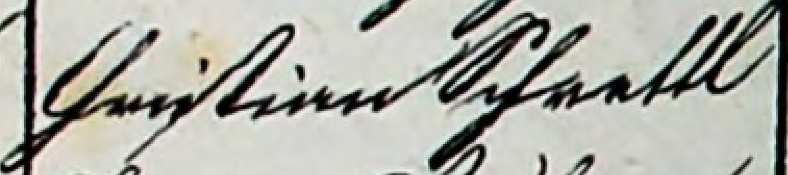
Christian Schrettl
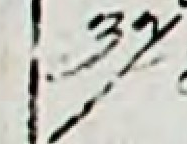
37
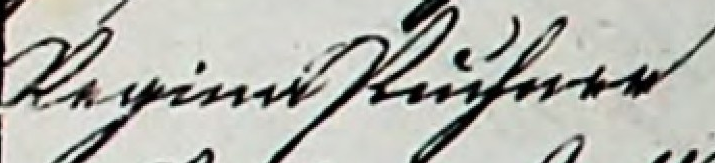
Regina Puchner
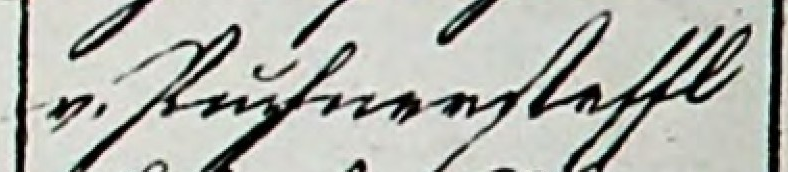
v. Puchnersteffl
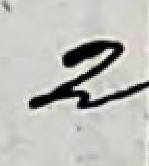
2
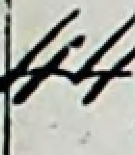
44
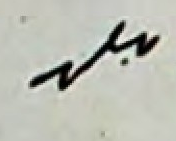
do
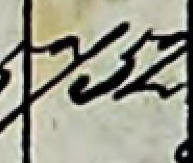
752
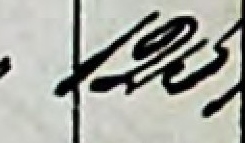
125
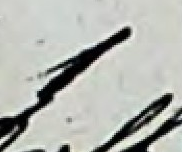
1
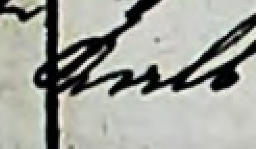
Kalb
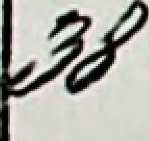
38
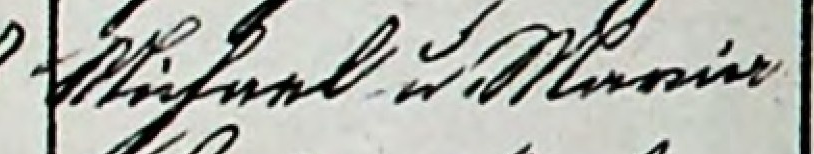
Michael u. Maria
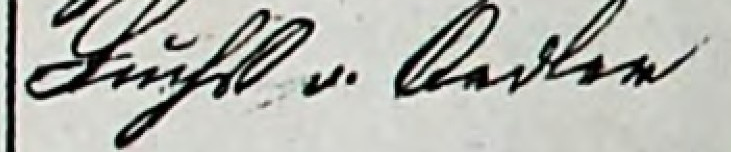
Fuchs v. Oedler
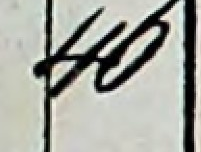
46
